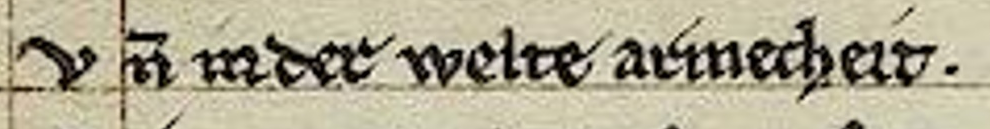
Vn(d) in der welte armecheit.
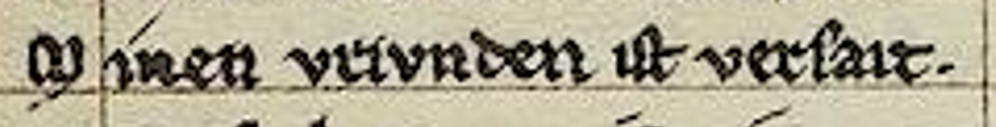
Minen vrivnden iſt verſait.
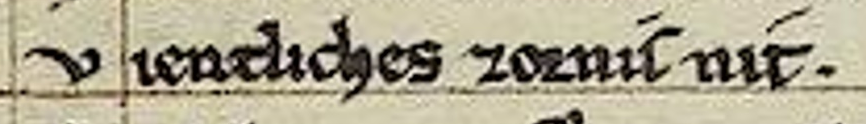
Vientliches zorniſ nit.
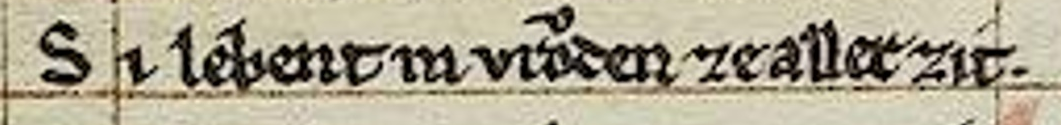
Si lebent in vro°vden ze aller zit.
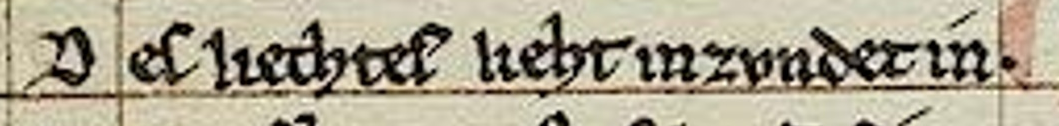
Deſ liechteſ lieht inzvndet in.
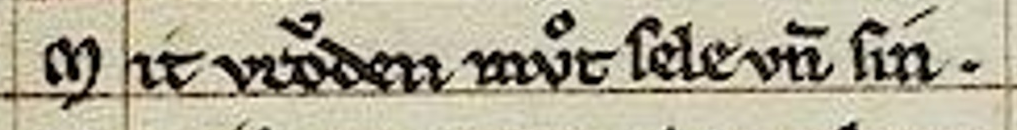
Mit vro°vden mv°ot ſele vn(d) ſin.
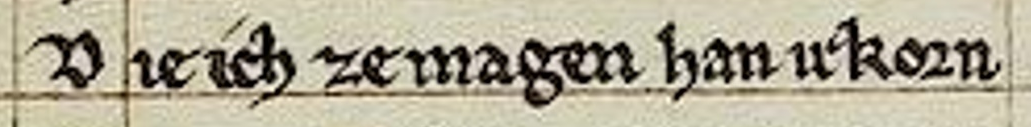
Die ich ze magen han irkorn.
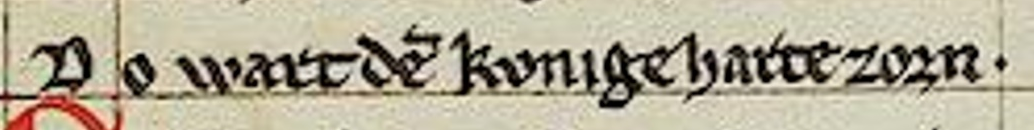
Do wart de(m) kvnige harte zorn.
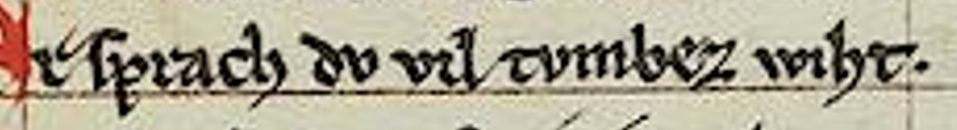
*Er ſprach dv vil tvmbez wiht.
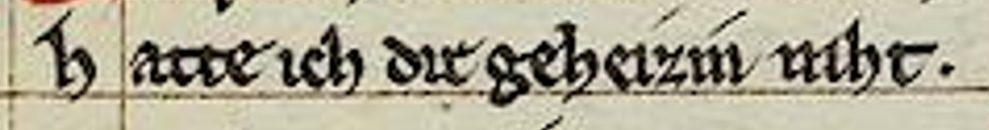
Hatte ich dir geheizin niht.
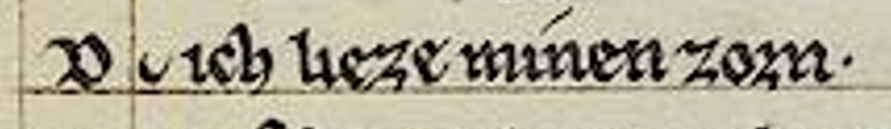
D(az) ich lieze minen zorn.
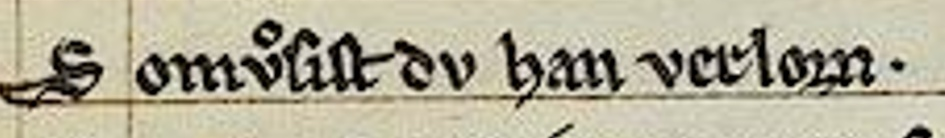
Somv°oſiſt dv han verlorn.
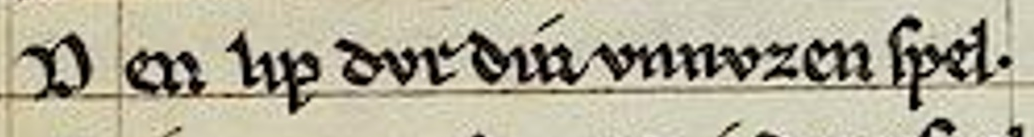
Den lip dvr din vnnvzen ſpel.
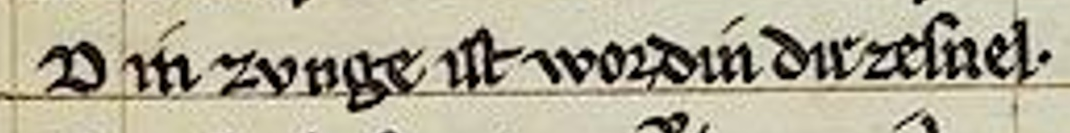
Din zvnge iſt wordin dir zeſnel.
